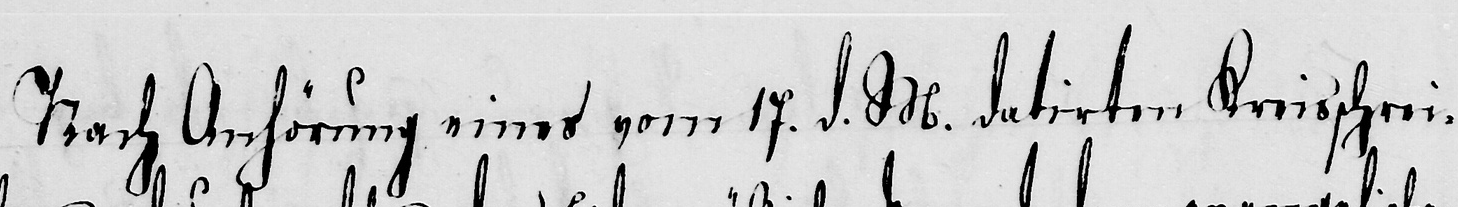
Nach Anhörung eines vom 17. d. M. datirten Kreisschrei¬
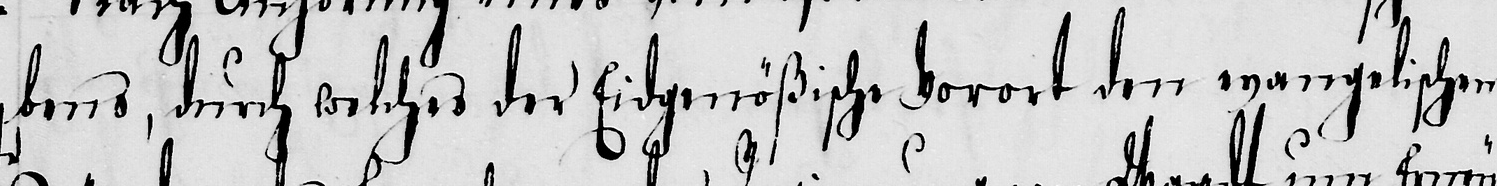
bens, durch welches der Eidgenößische Vorort den evangelischen
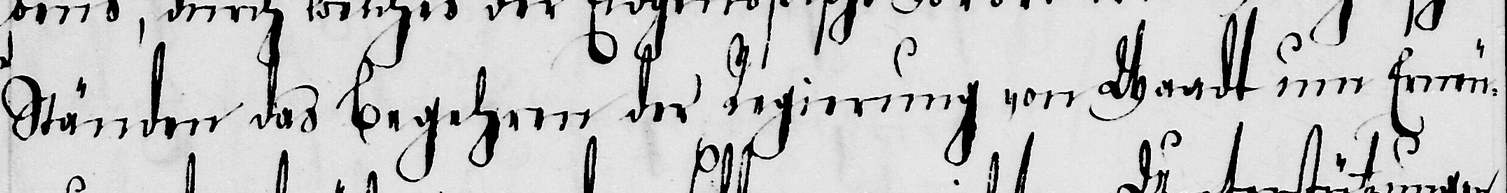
Ständen das Begehren der Regierung von Waadt um Erneu¬
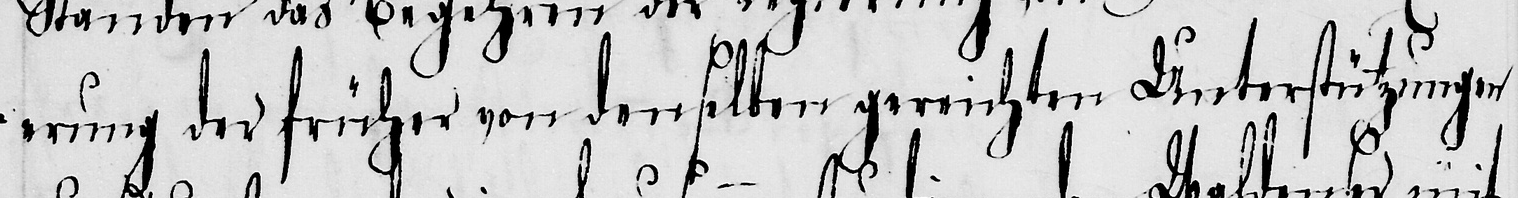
erung der früher von denselben gereichten Unterstützungen
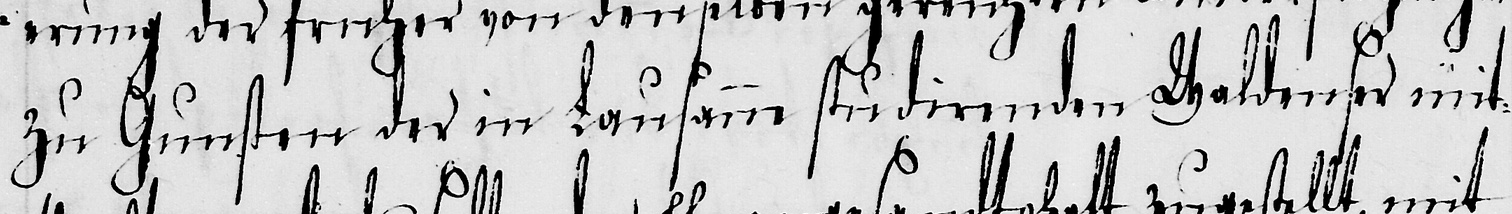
zu Gunsten der in Lausanne studirenden Waldenser mit¬
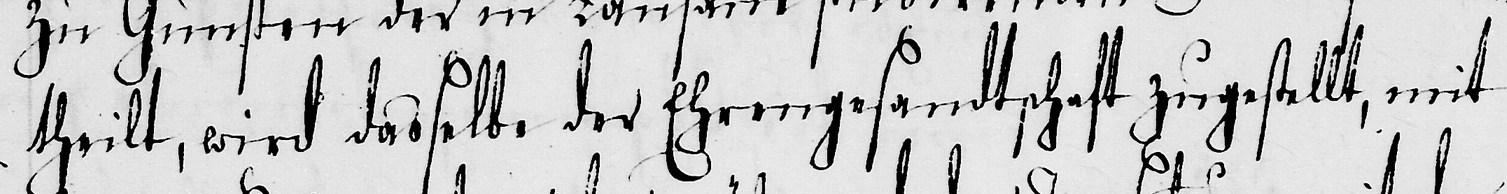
theilt, wird dasselbe der Ehrengesandtschaft zugestellt,
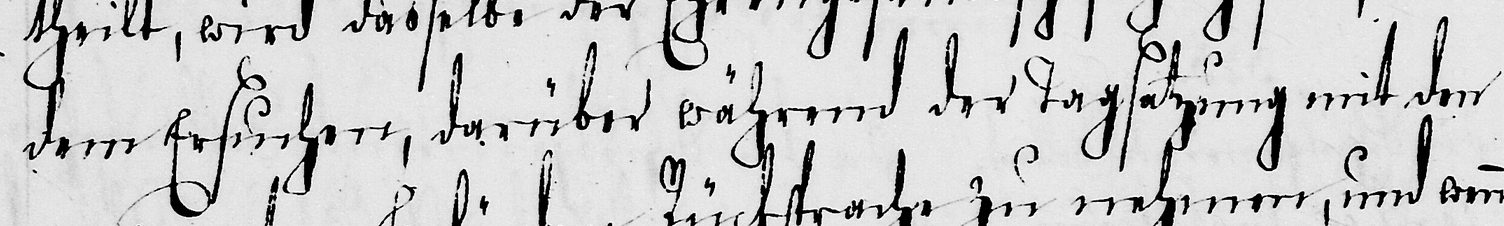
dem Ersuchen, darüber während der Tagsatzung mit den
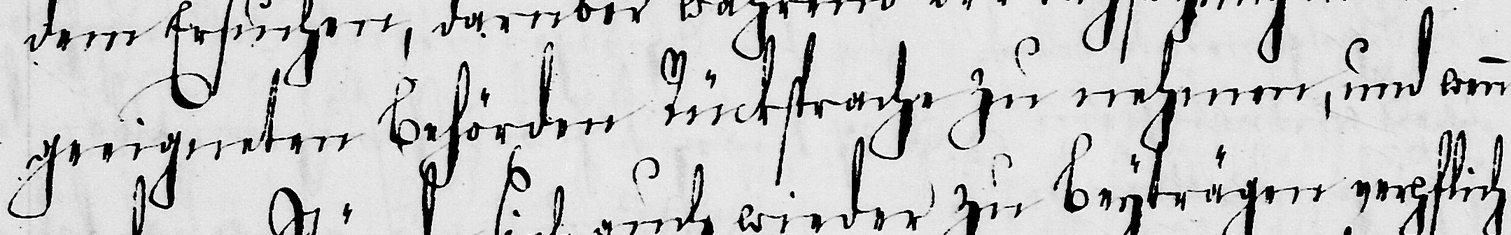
geeigneten Behörden Rücksprache zu nehmen, und wenn
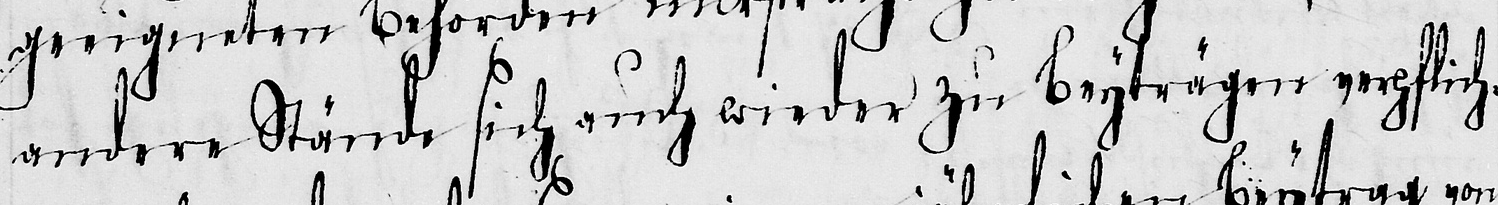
andere Stände sich auch wieder zu Beyträgen verpflic¬
